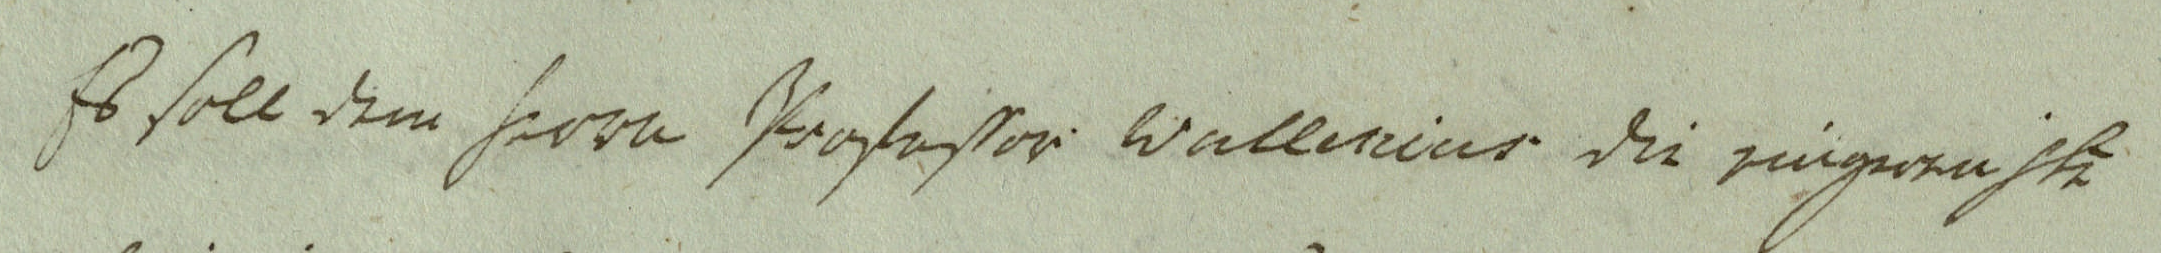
Es soll dem herrn Professor Wallenius die eingereichte
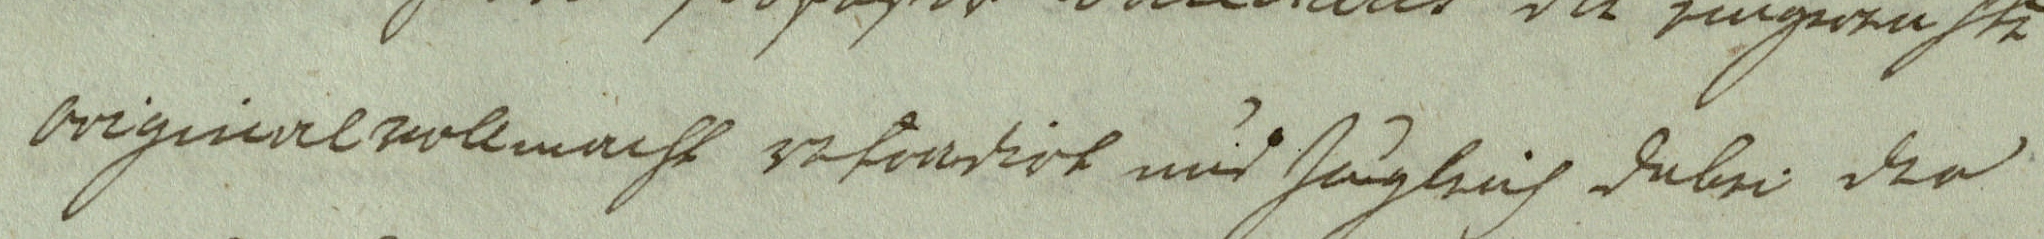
originalvollmacht retradirt und zugleich dabei der
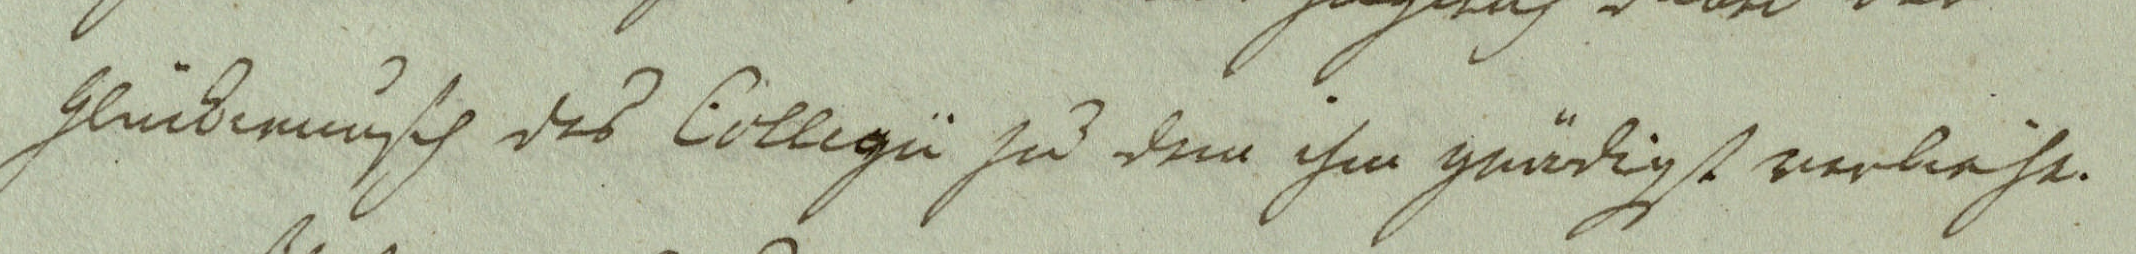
Glückwunsch des Collegii zu dem ihm gnädigst verliehe¬
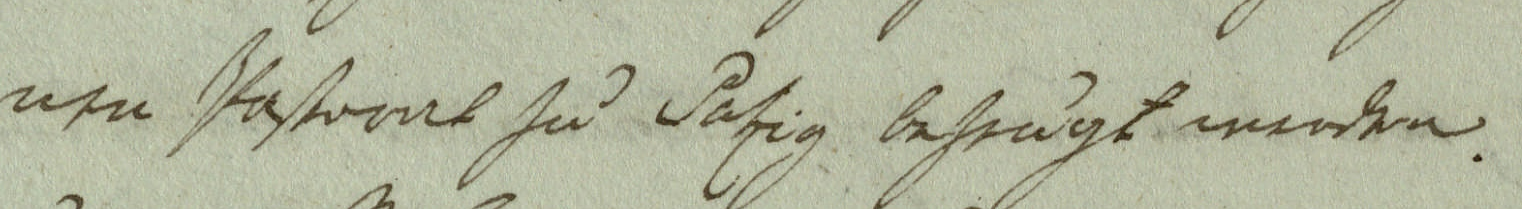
nen Pastorat zu Patzig bezeugt werden.
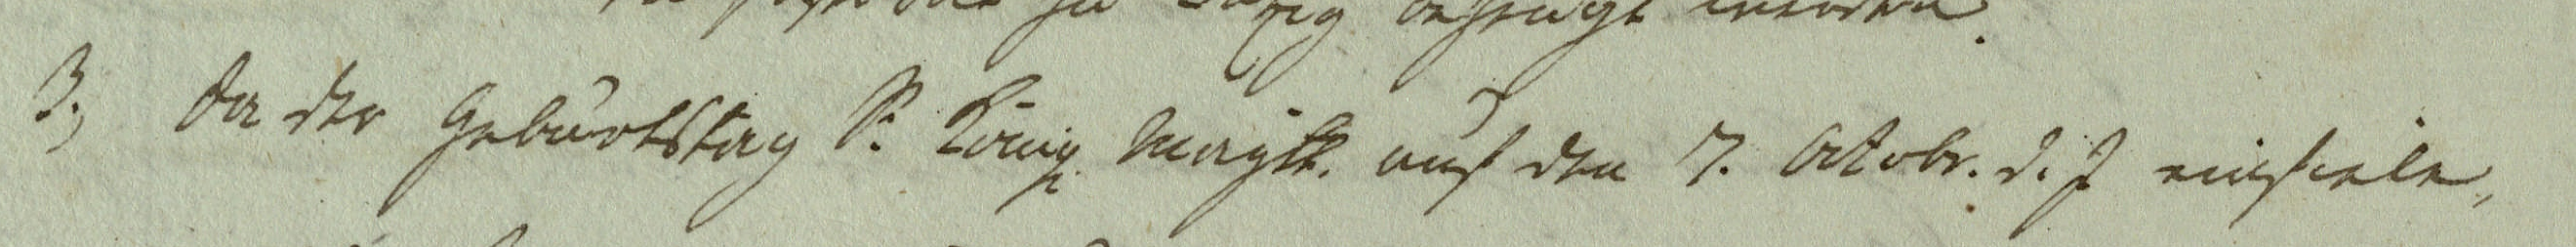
3. da der Geburtstag Sr. Königl. Maÿtt. auf den 7. Octobr. d. J. einfiele,
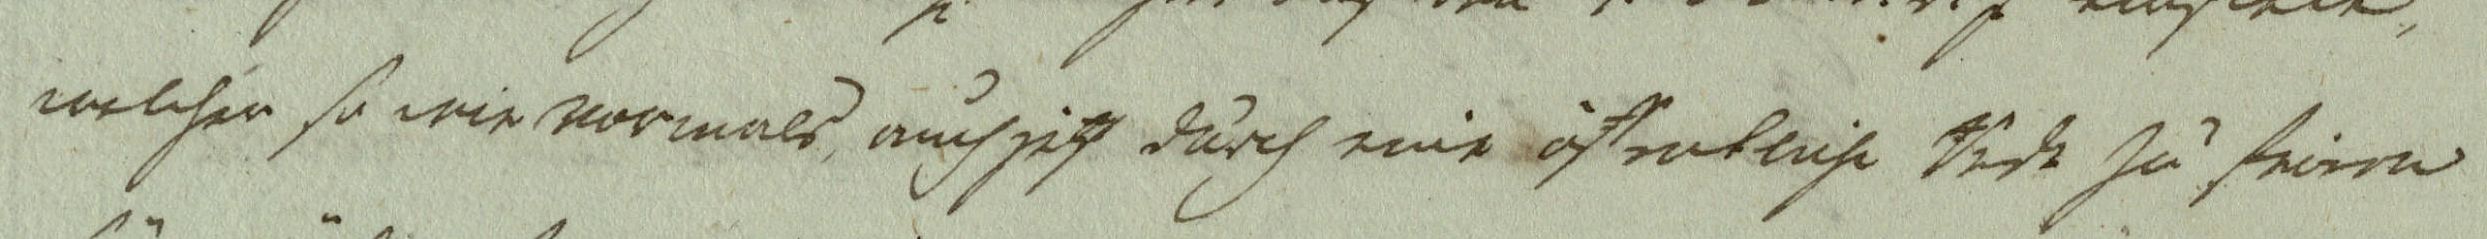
welcher so wie vormals, auch jetzt durch eine öffentliche Rede zu feiern
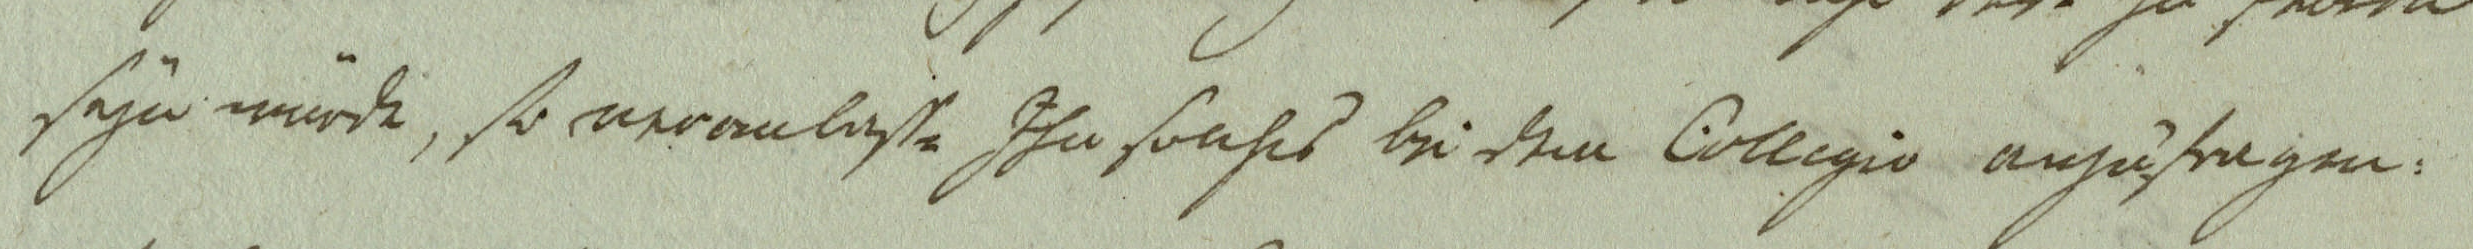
seÿn würde, so veranlasse Ihn solches bei dem Collegio anzufragen:
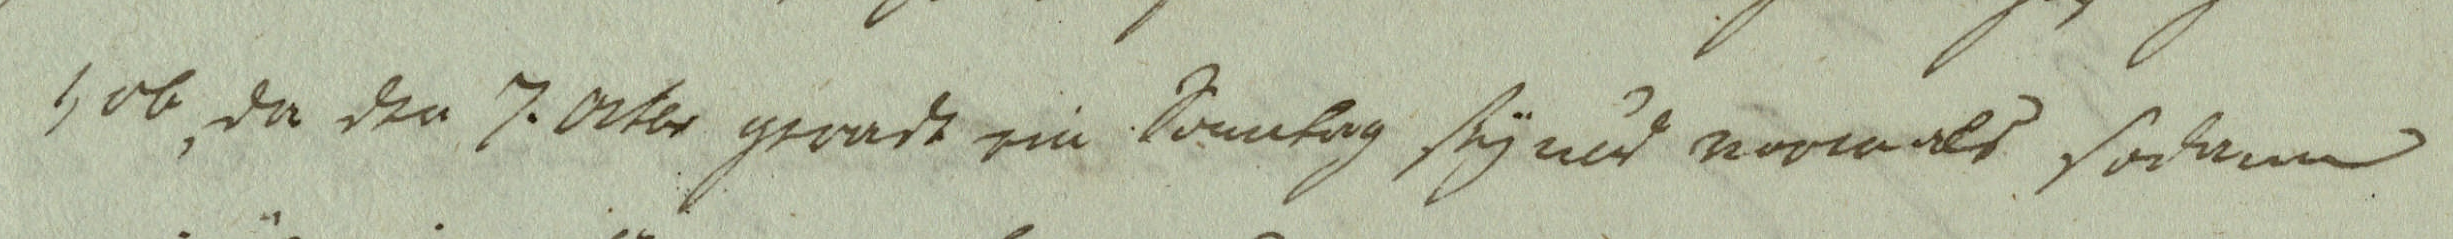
1, ob, da der 7. Octbr. gerade ein Sonntag seÿ und vormals sodann
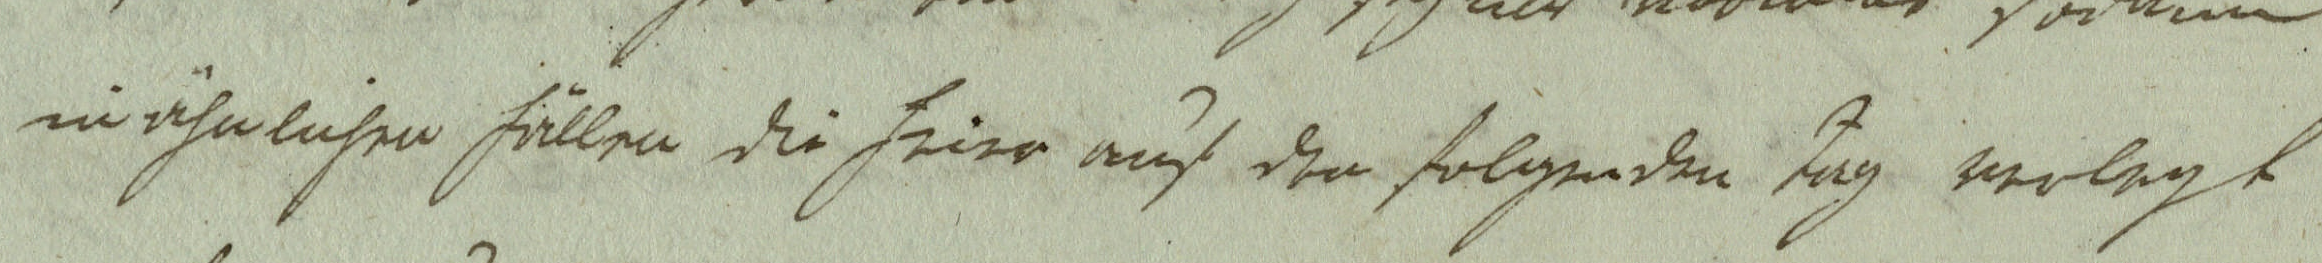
in ähnlichen Fällen die Feier auf den folgenden Tag verlegt
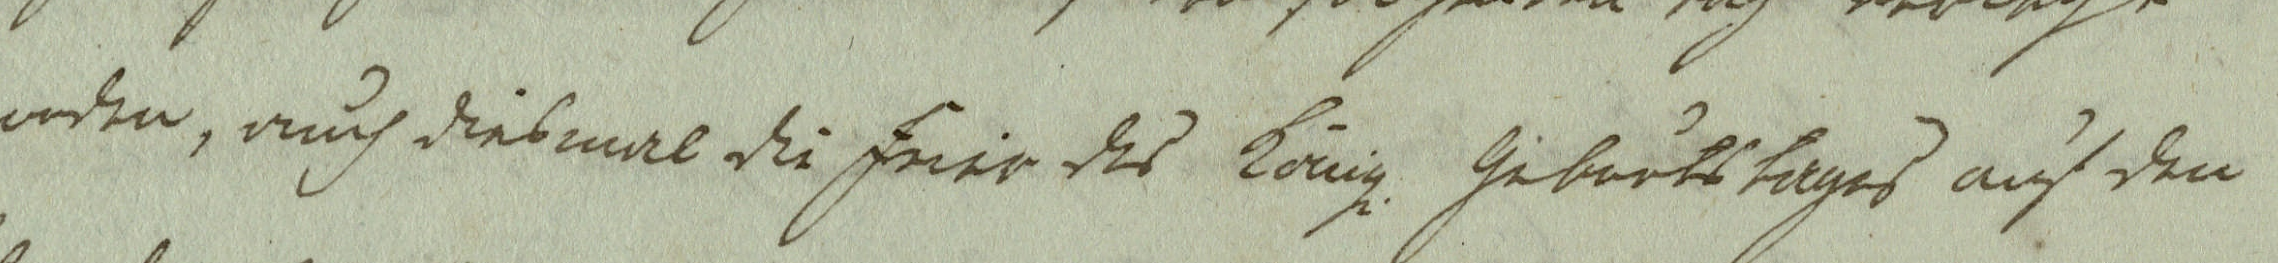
worden, auch diesmal die Feier des Königl. Geburtstages auf den
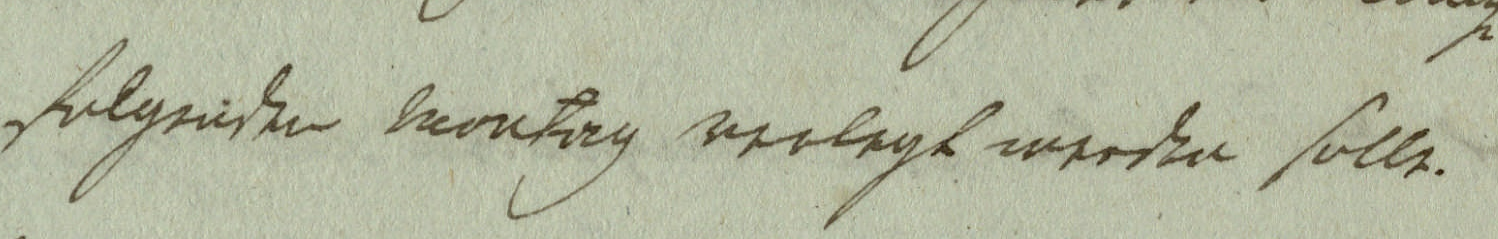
folgenden Montag verlegt werden solle.
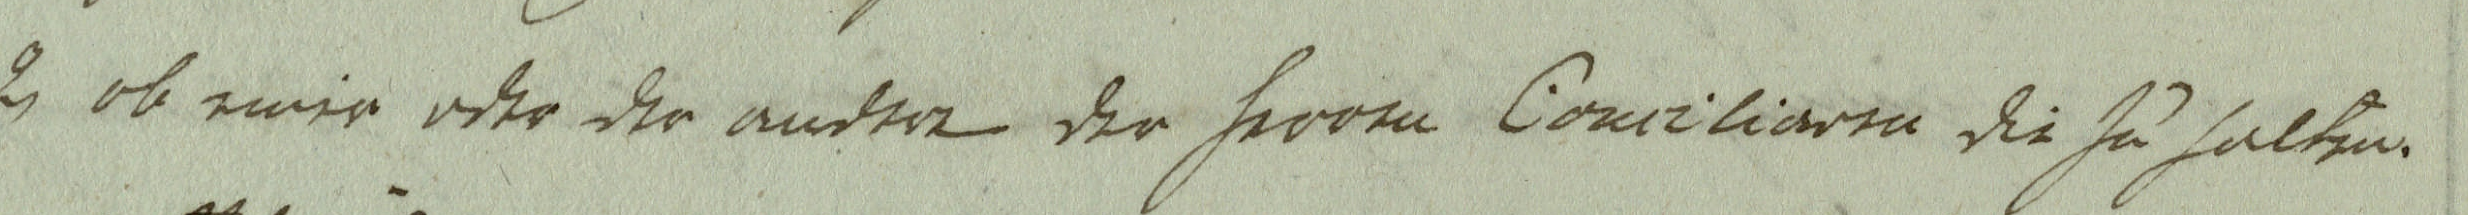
2, ob einer oder der andere der herren Conciliaren die zu halten¬
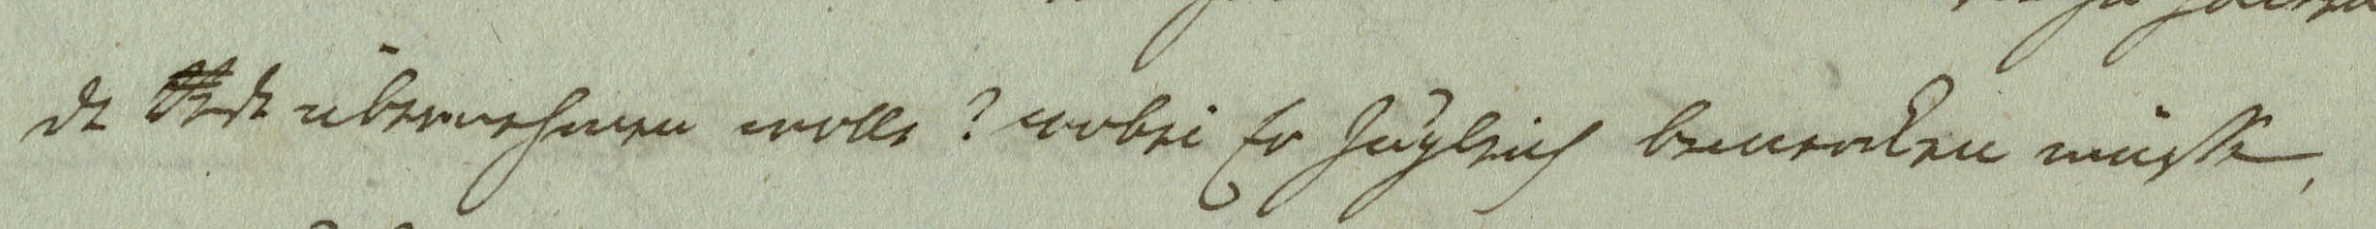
de Rede übernehmen wolle? wobei Er zugleich bemercken müsse,
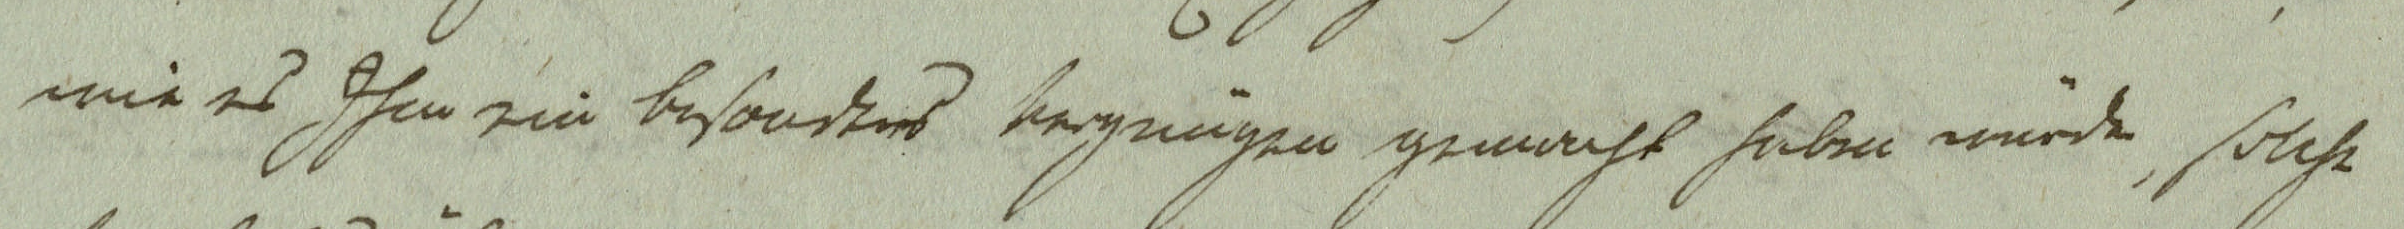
wie es Ihm ein besonderes Vergnügen gemacht haben würde, solche
